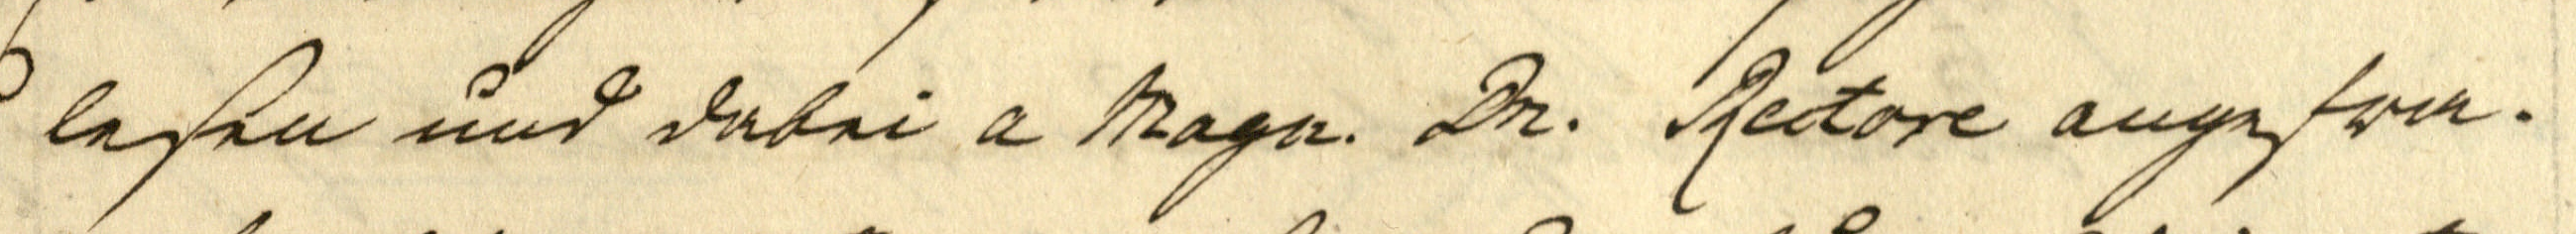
lesen und dabei a Magn. Dn. Rectore angefra-
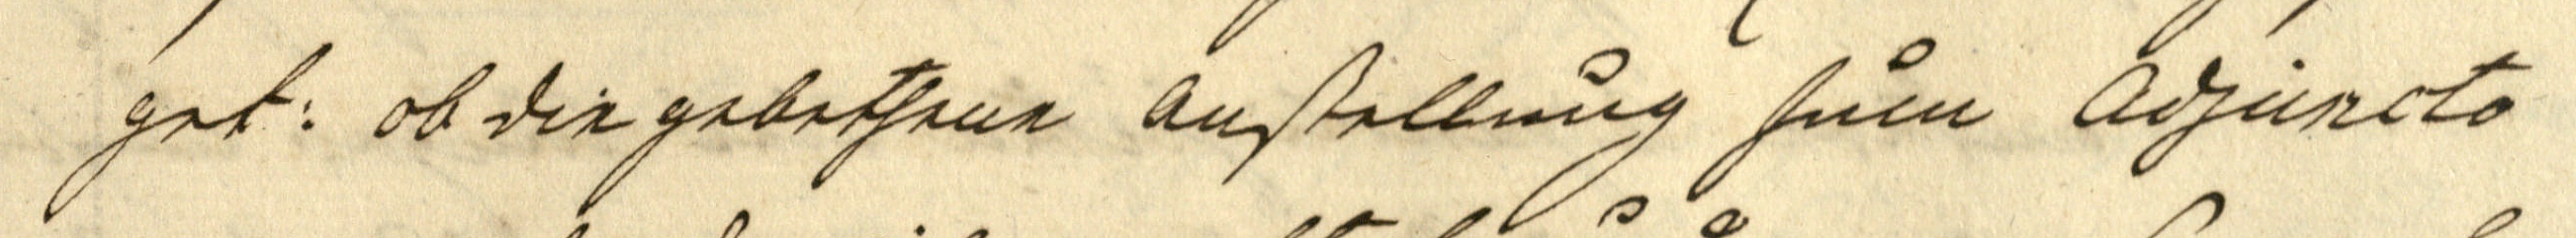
get: ob die gebethene Anstellung zum Adjuncto
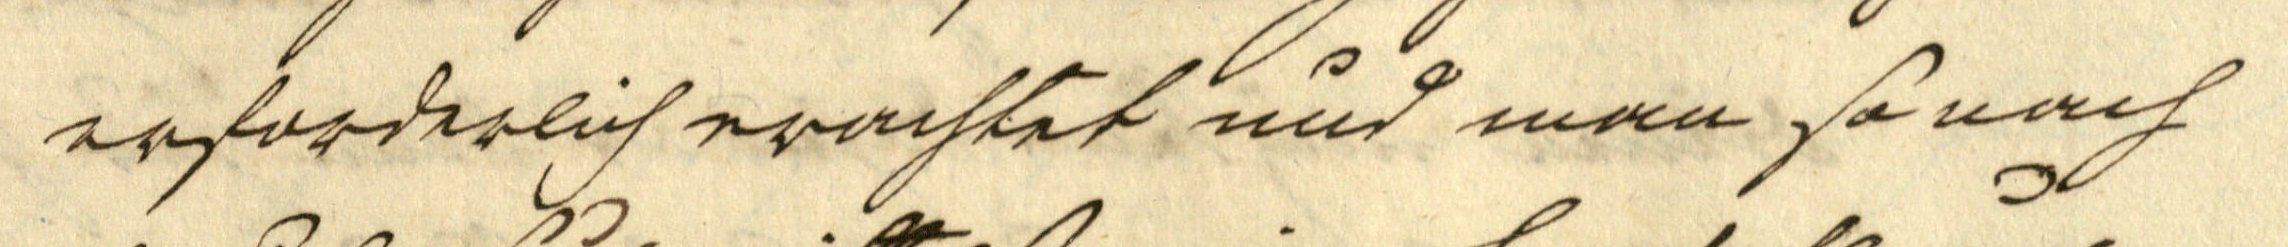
erforderlich erachtet und man so nach
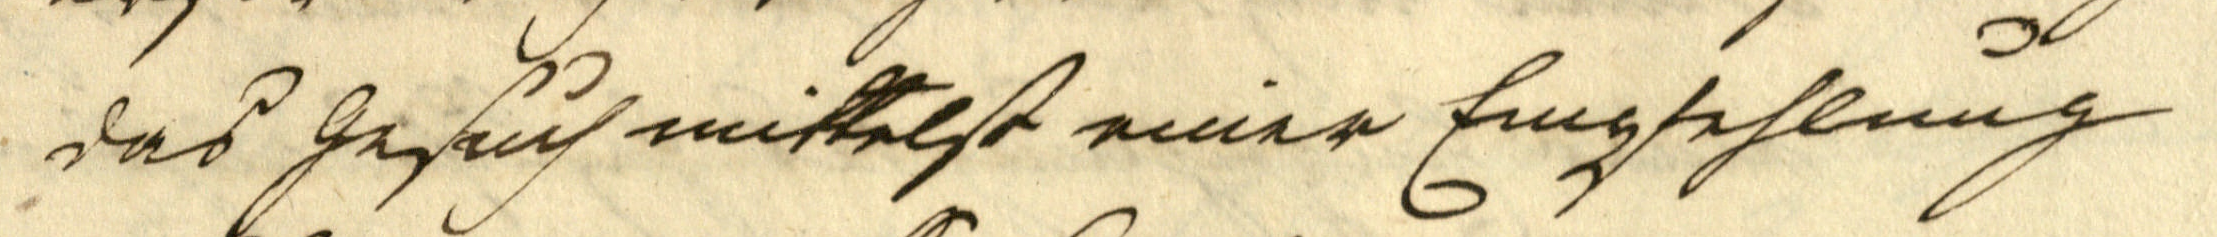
das Gesuch mittelst einer Empfehlung
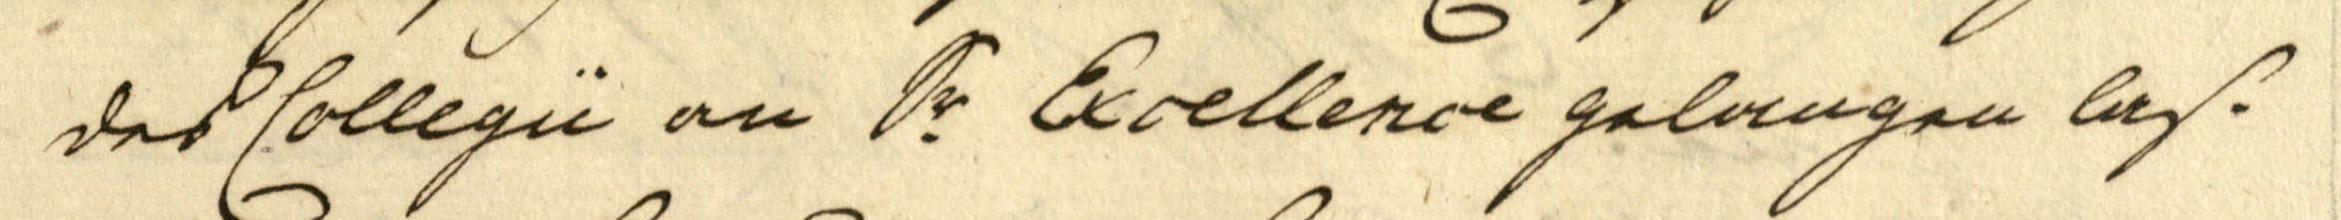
des Collegii an Sr. Excellence gelangen las-
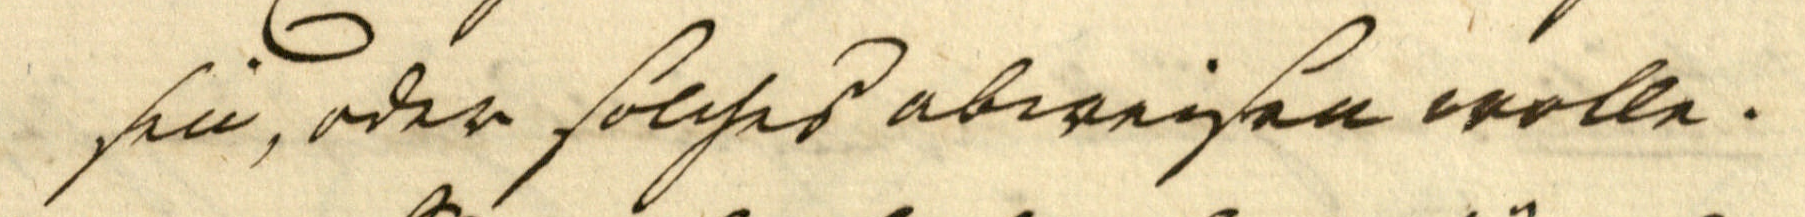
sen, oder solches abweisen wolle.
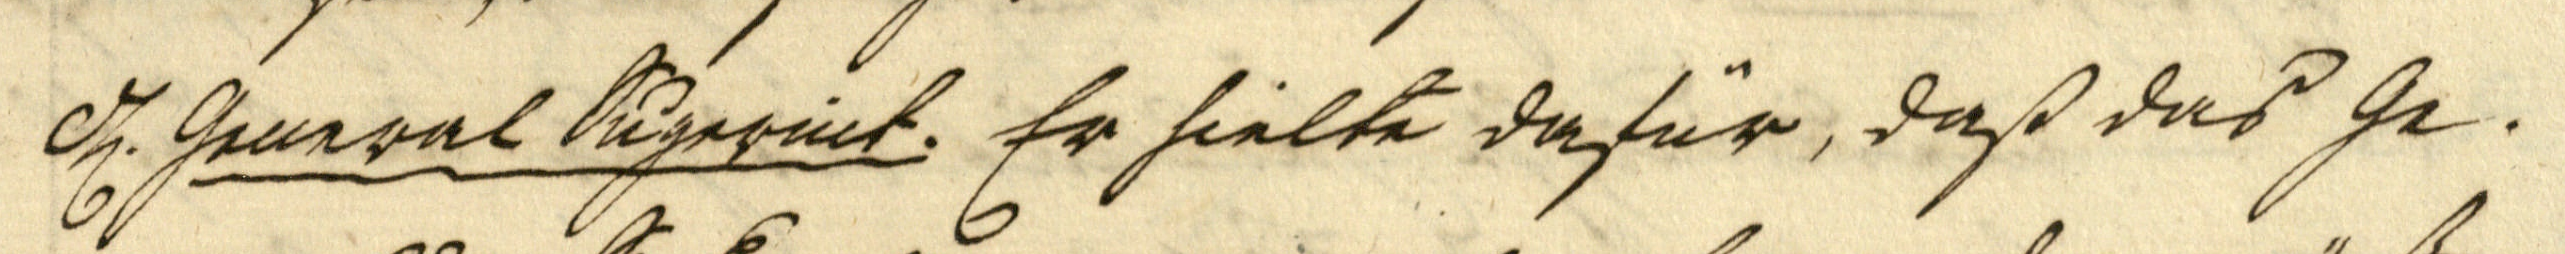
dh. General Superint. Er hielte dafür, daß das Ge-
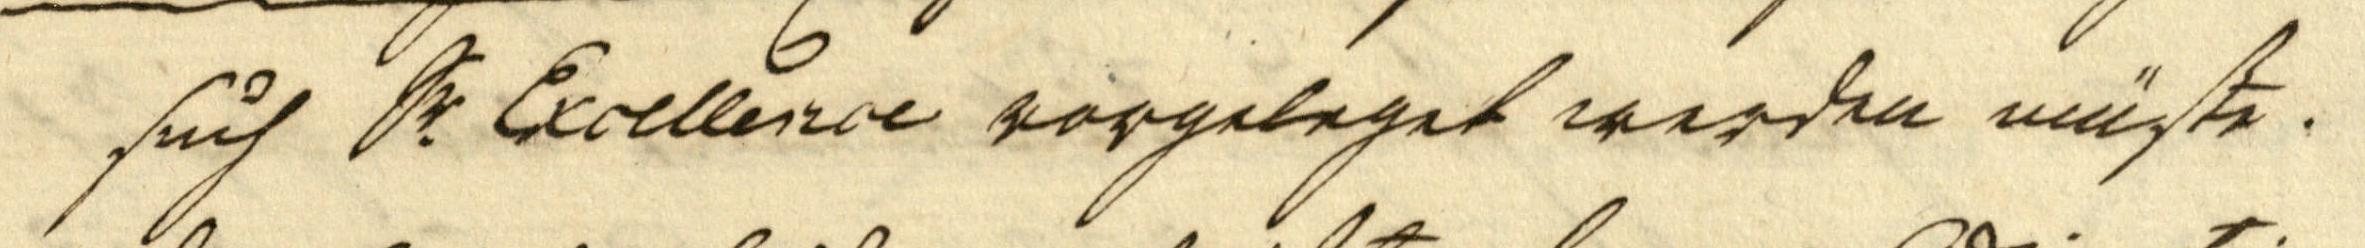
such Sr. Excellence vorgeleget werden müßte.
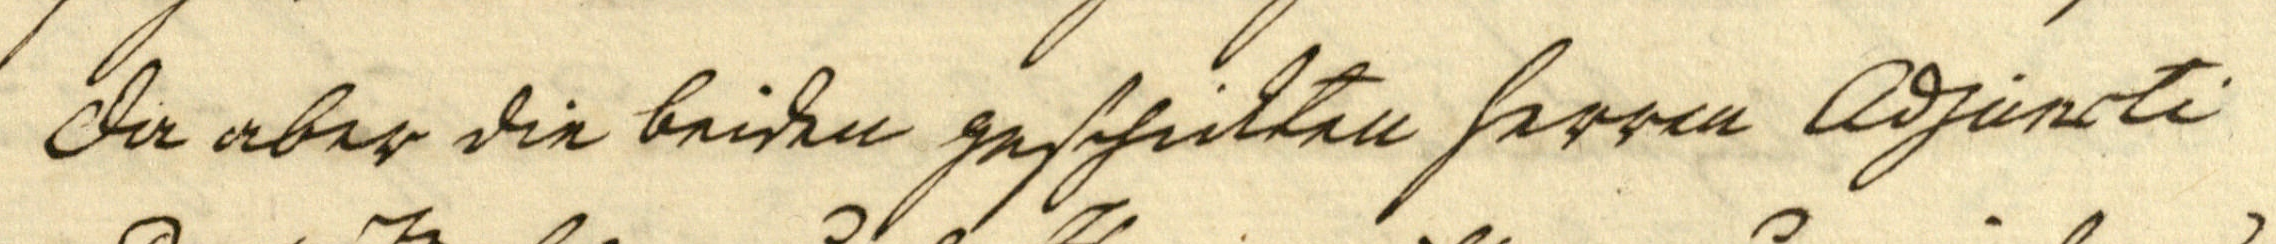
da aber die beiden geschikten herren Adjuncti
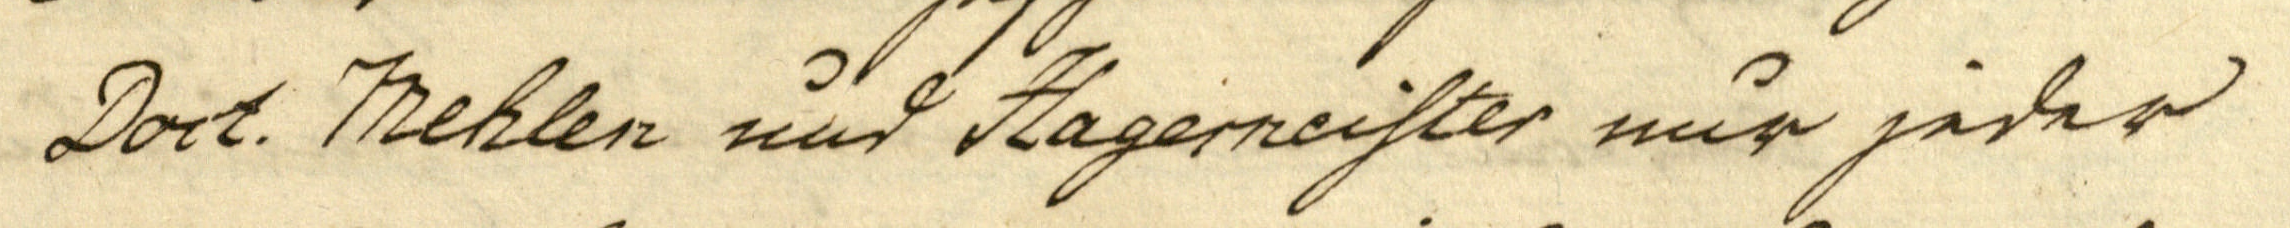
Doct. Mehlen und Hagemeister nur jeder
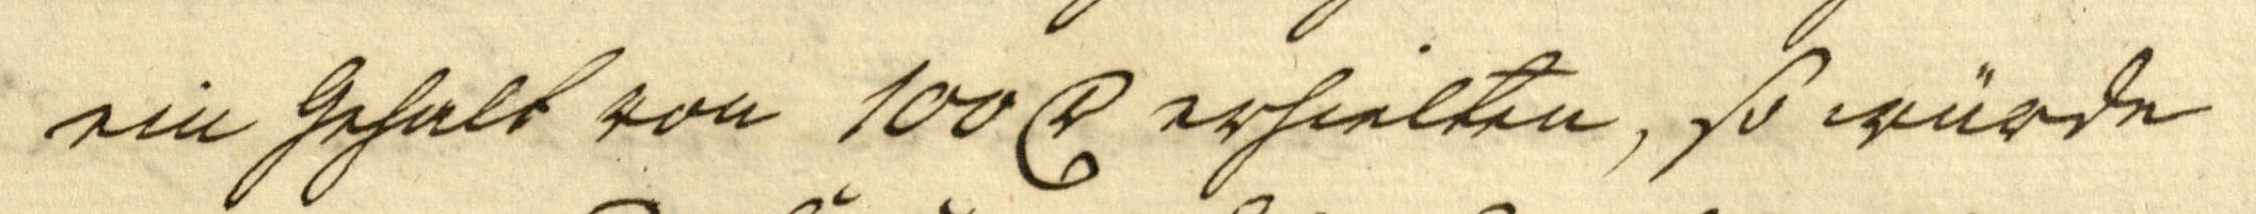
ein Gehalt von 100 rtl erhielten, so würde
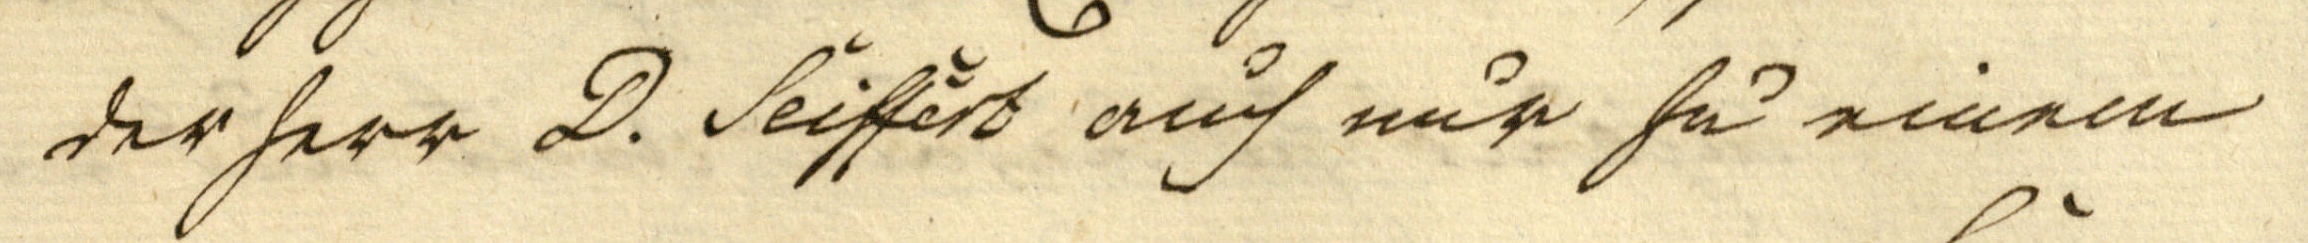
der herr D. Seiffert auch nur zu einem
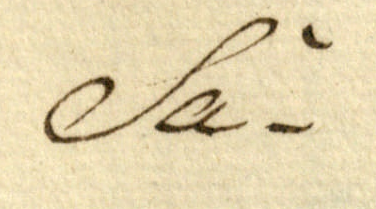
Sa-
